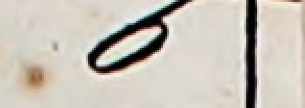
6
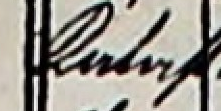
Katast.
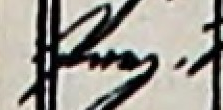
Parz
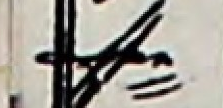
Hn
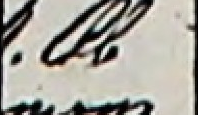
Ob
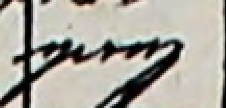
ganz
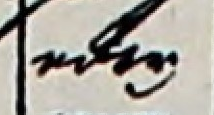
oder
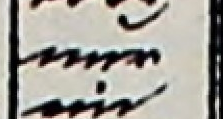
nur
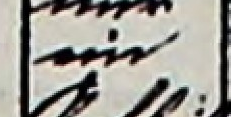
ein
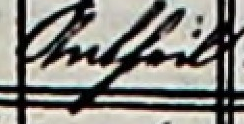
Antheil
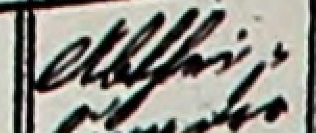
Abthei„
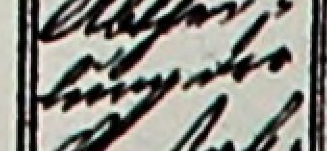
lung der
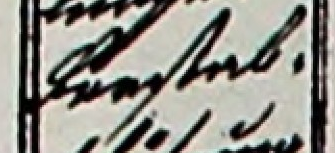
Fanstab„
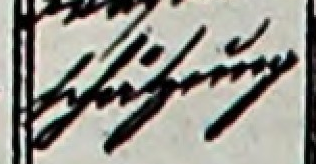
schätzung
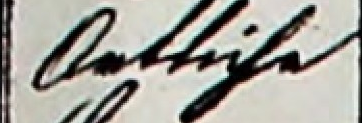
Örtliche
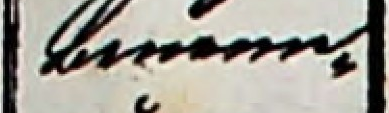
Benenn„
